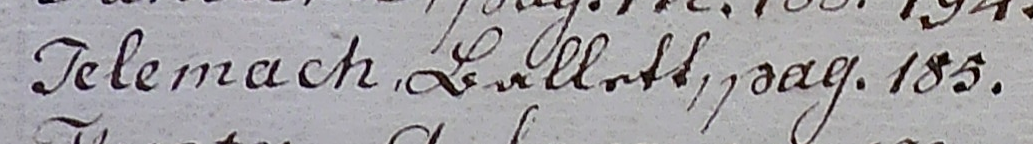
Telemach, Ballett, pag. 185.
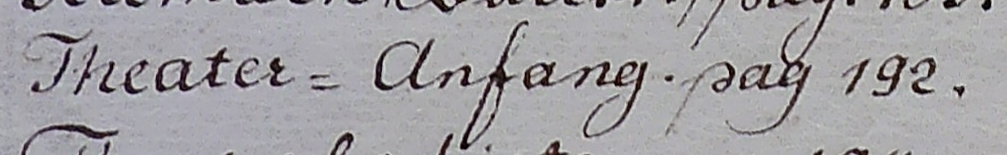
Theater=Anfang. pag. 192.
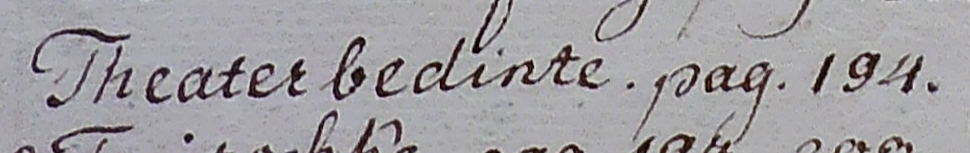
Theaterbediente. pag. 194.
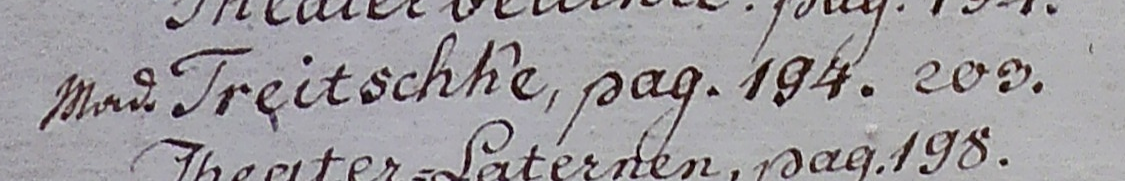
Mad. Treitschke, pag. 194. 203.
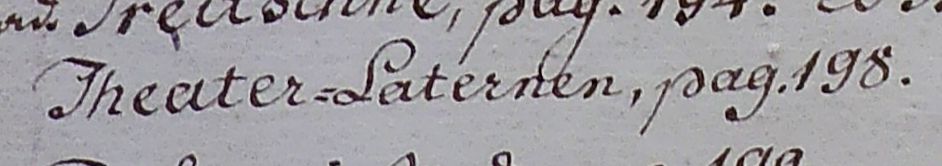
Theater=Laternen, pag. 198.
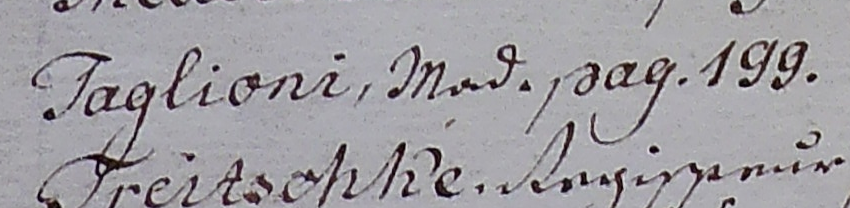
Taglioni, Mad. pag. 199.
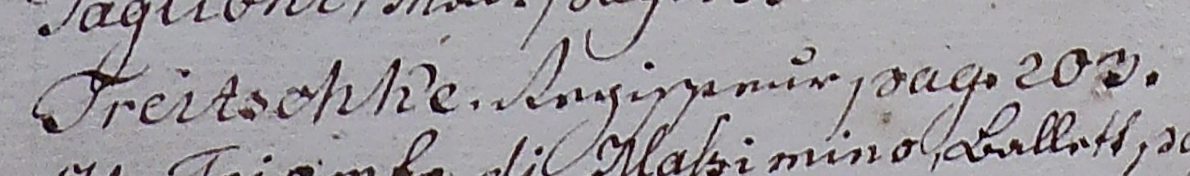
Treitschke. Regisseur pag. 203.
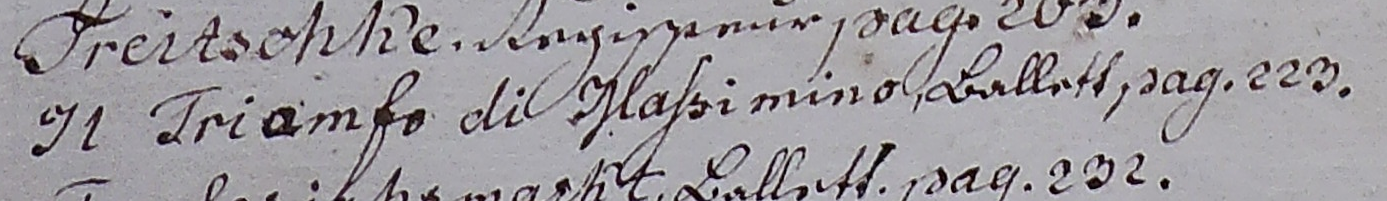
Il Triomfo di Massimino, Ballett pag. 223.
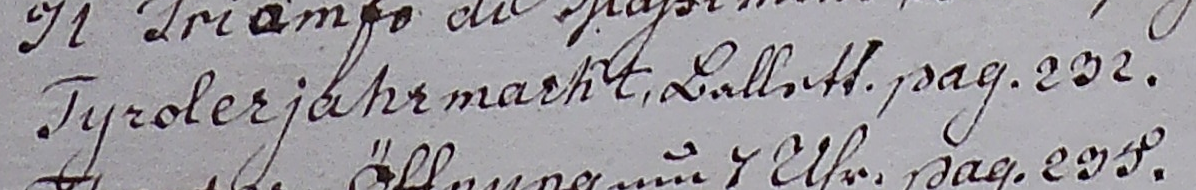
Tyrolerjahrmarkt, Ballett. pag. 232.
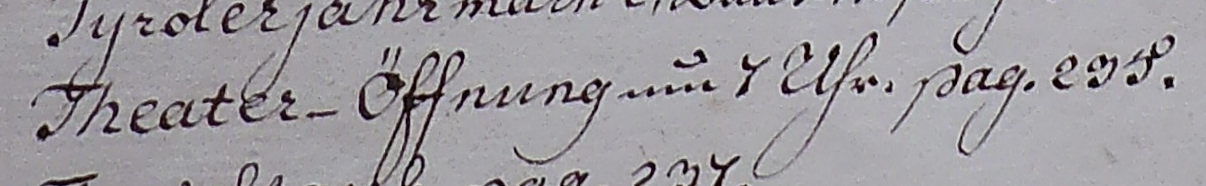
Theater_Öffnung um 7 Uhr. pag. 235.
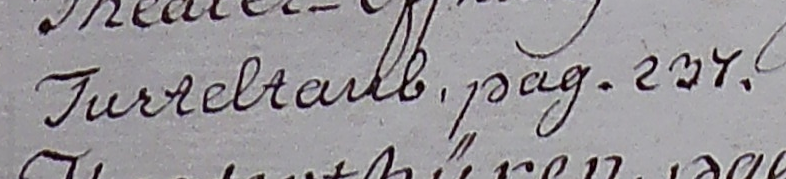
Turteltaub, pag. 237.
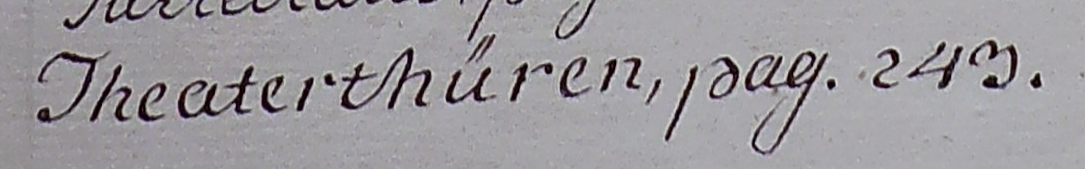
Theaterthüren, pag. 243.
